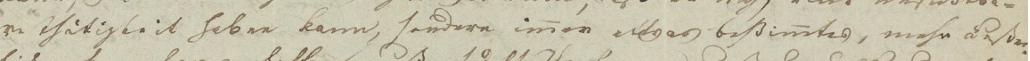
re Thätigkeit haben kann, sondern immer etwas bestimmtes, mehr äußer-
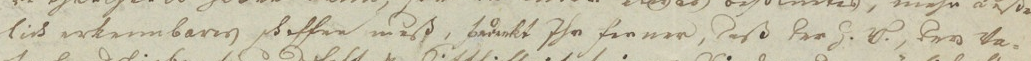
lich erkennbares schaffen muß, bedenkt Ihr ferner, daß der Z.V., der Va-
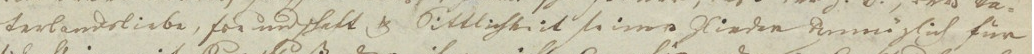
terlandsliebe, Freundschaft & Sittlichkeit seiner Glieder unmöglich für
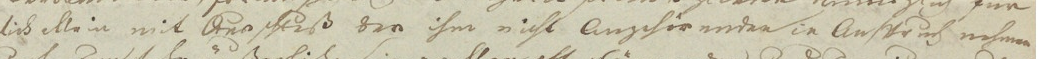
sich allein mit Ausschluß der ihm nicht Angehörenden in Anspruch nehmen
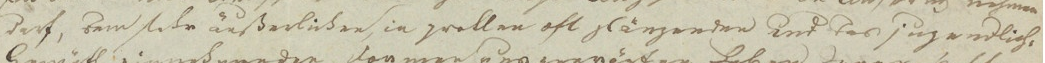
darf, dem sehr äußerlichen, in grellen oft glänzenden und das jugendliche
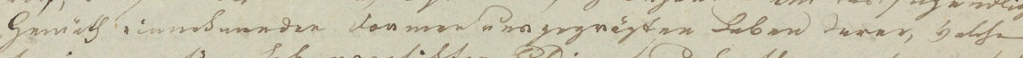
Gemüth einnehmenden Formen ausgeprägten Leben derer, welche
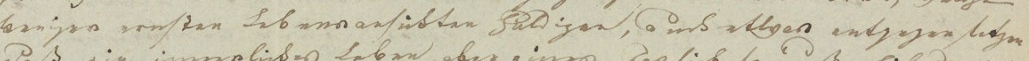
weniger ernsten Lebensansichten huldigen, auch etwas entgegensetzen
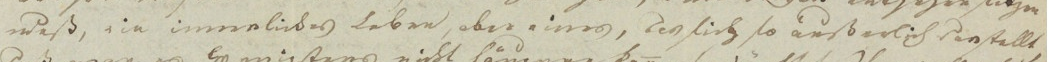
muß, ein innerliches Leben, aber eines, das sich so äußerlich darstellt,
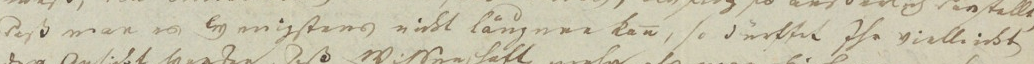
daß man es wenigstens nicht läugnen kann, so dürftet Ihr vielleicht
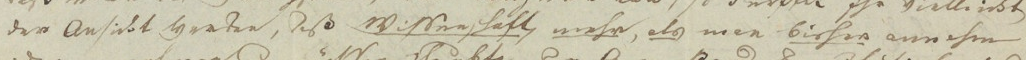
der Ansicht werden, daß Wissenschaft mehr, als man bisher annahm
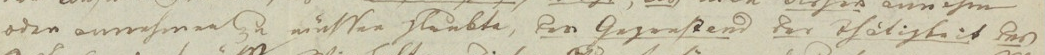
oder annehmen zu müssen glaubte, der Gegenstand der Thäthigkeit des
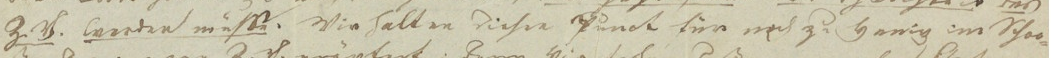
Z.V. werden müsse. Wir halten diesen Punct für noch zu wenig im Schoo-
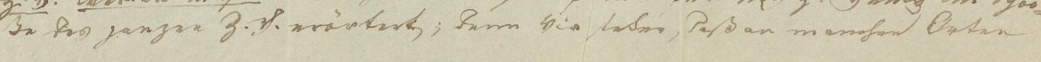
ße des ganzen Z.V. erörtert; denn wir sehen, daß an manchen Orten
